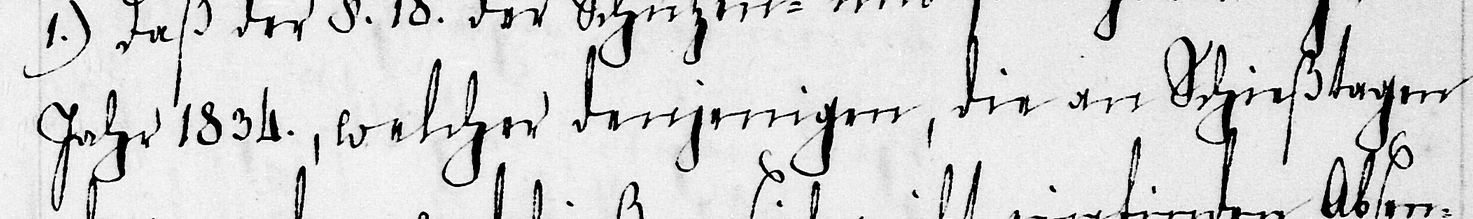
Jahr 1834., welcher denjenigen, die an Schießtagen
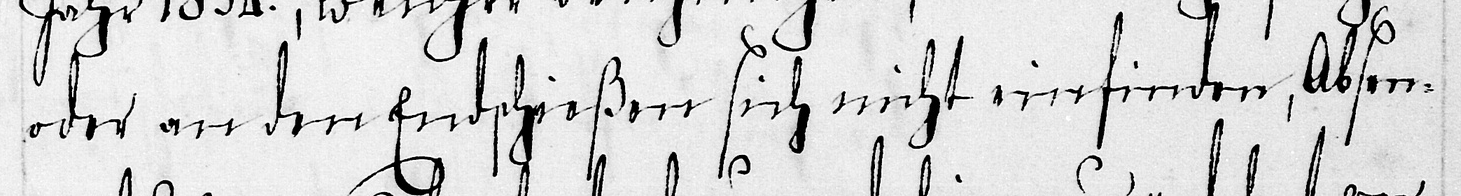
oder an den Endschießen sich nicht einfinden, Absen¬
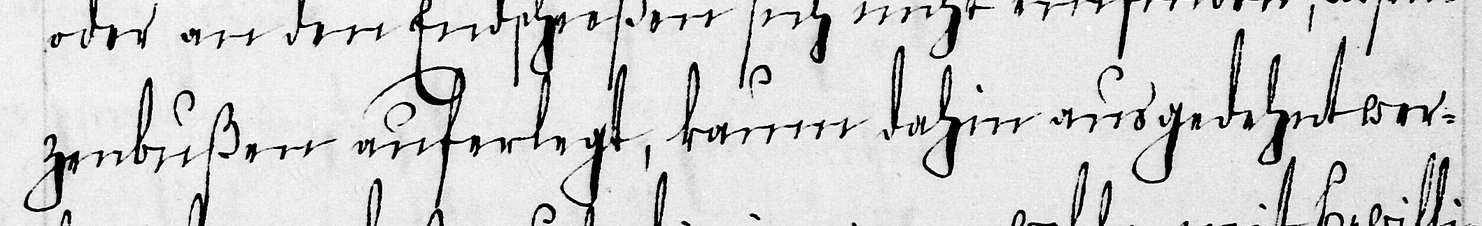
zenbußen auferlegt, kaum dahin ausgedehnt wer¬
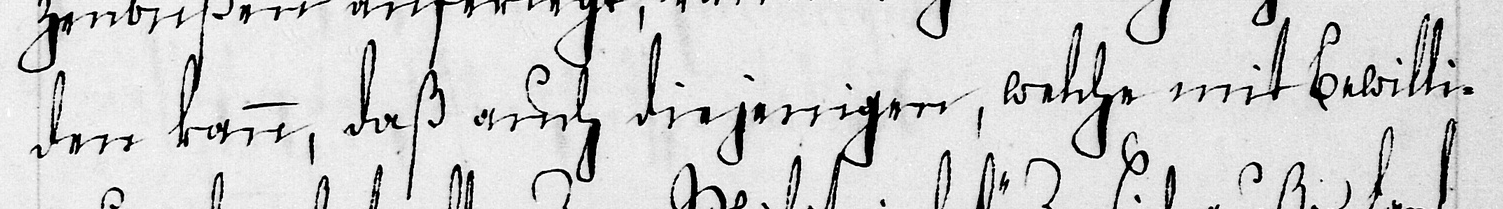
den kann, daß auch diejenigen, welche mit Bewilli¬
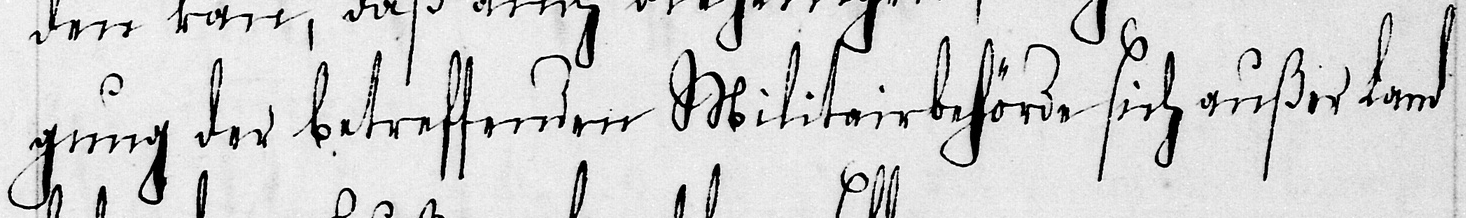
gung der betreffenden Militairbehörde sich außer Land
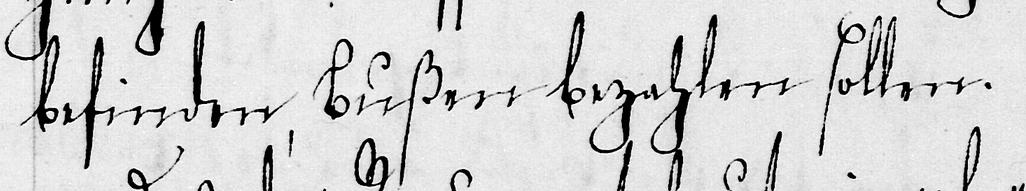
befinden, Bußen bezahlen sollen.
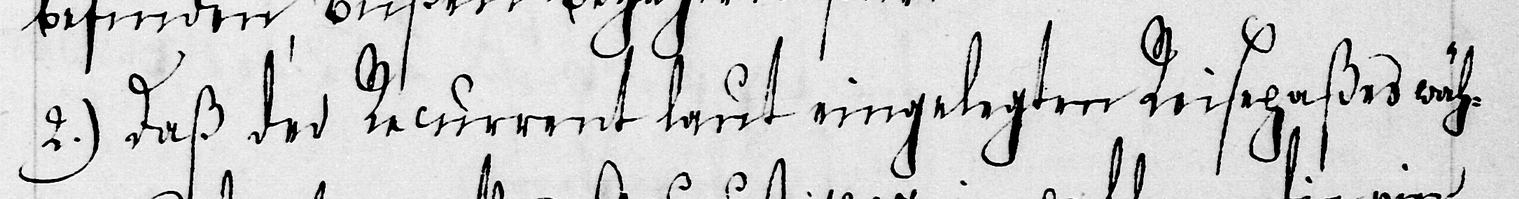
2.) Daß der Recurrent laut eingelegten Reisepaßes wäh¬
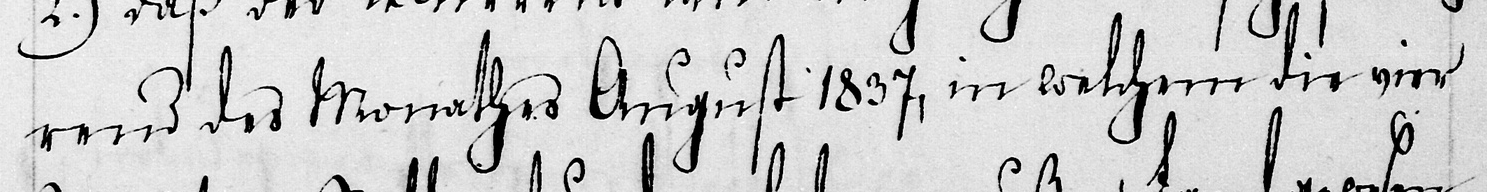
rend des Monathes August 1837, in welchem die vier
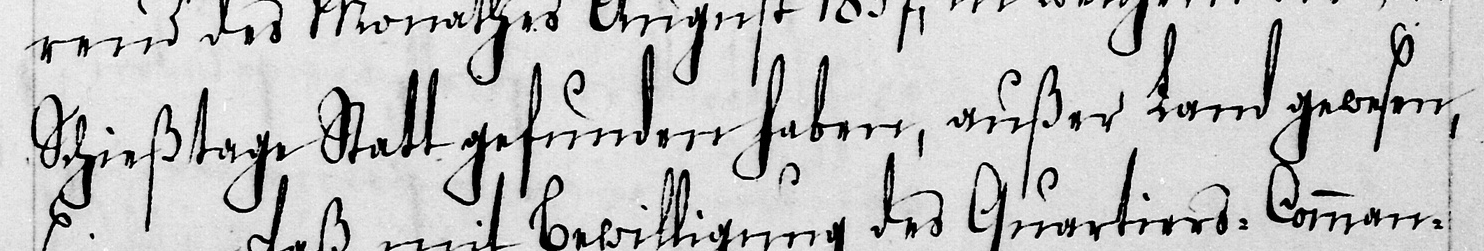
Schießtage Statt gefunden haben, außer Land gewesen,
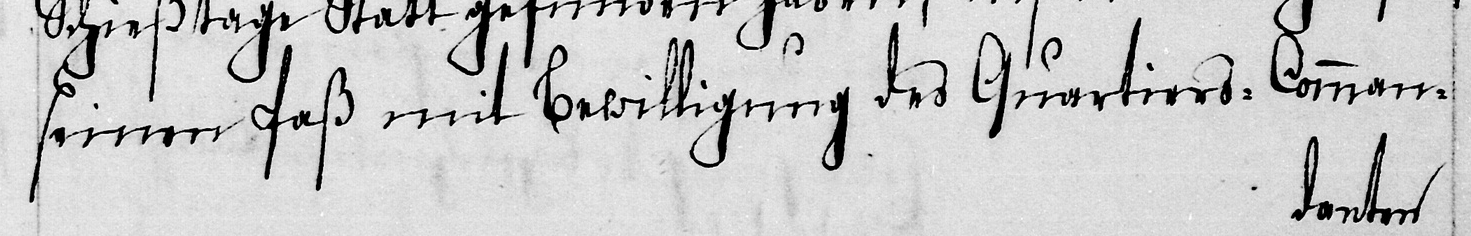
seinen Paß mit Bewilligung des Quartiers-Comman-
